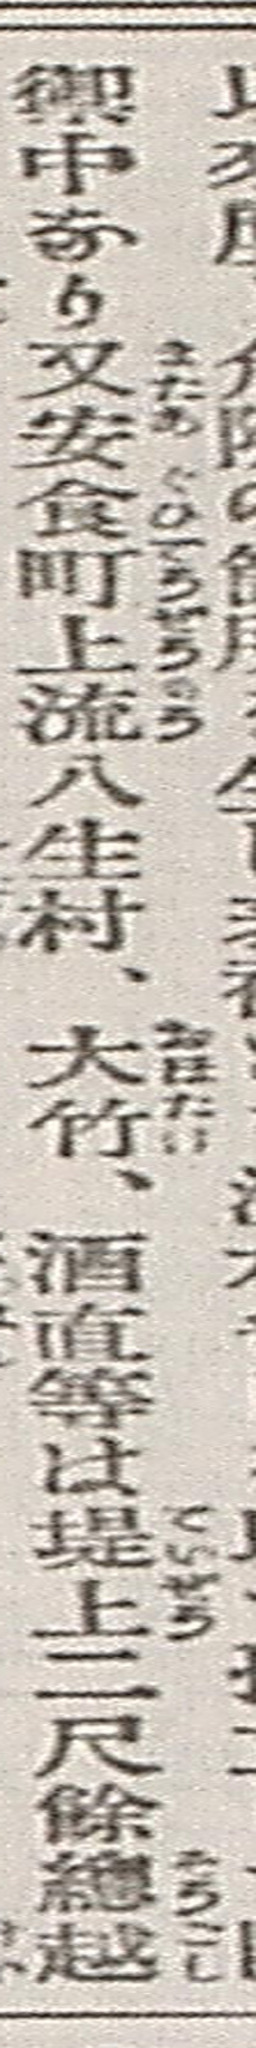禦中なり又安食町上流八生村、大竹、酒直等は提上二尺餘総越
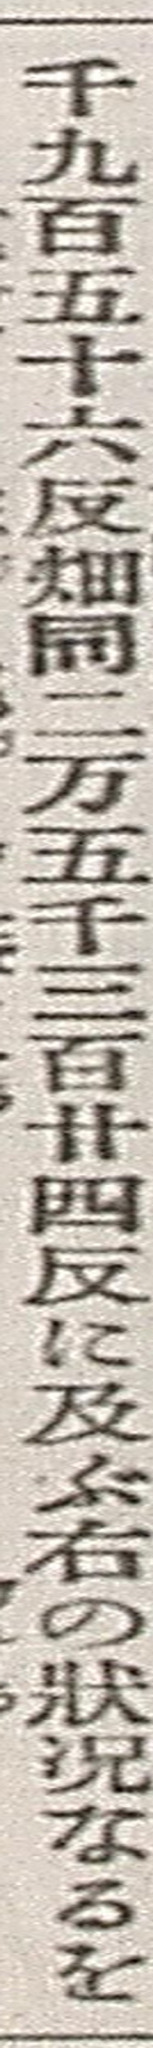千九百五十六反畑同二万五千三百廿四反に及ぶ右の状況なるを
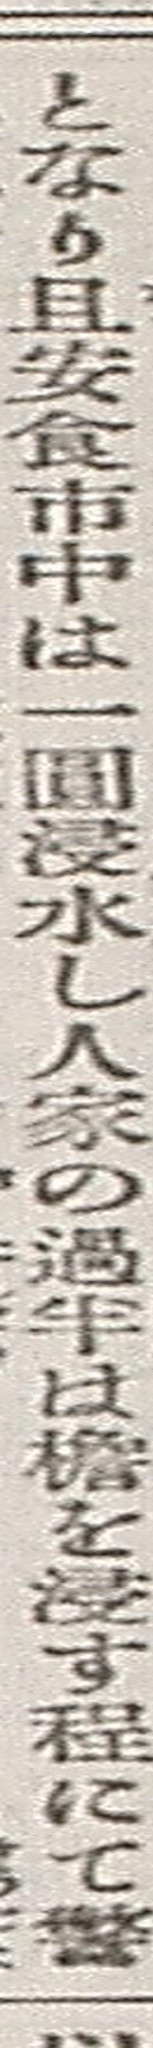となり且安食市中は一円浸水し人家の過半は檐を浸す程にて警
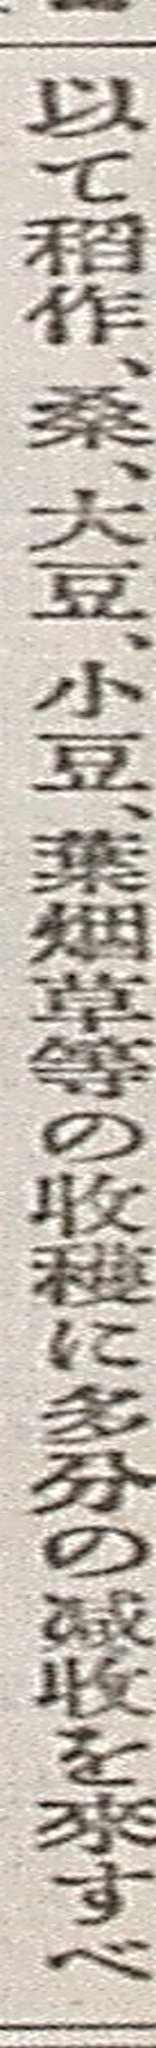以て稲作、桑、大豆、小豆、葉煙草等の収穫に多分の減収を来すべ
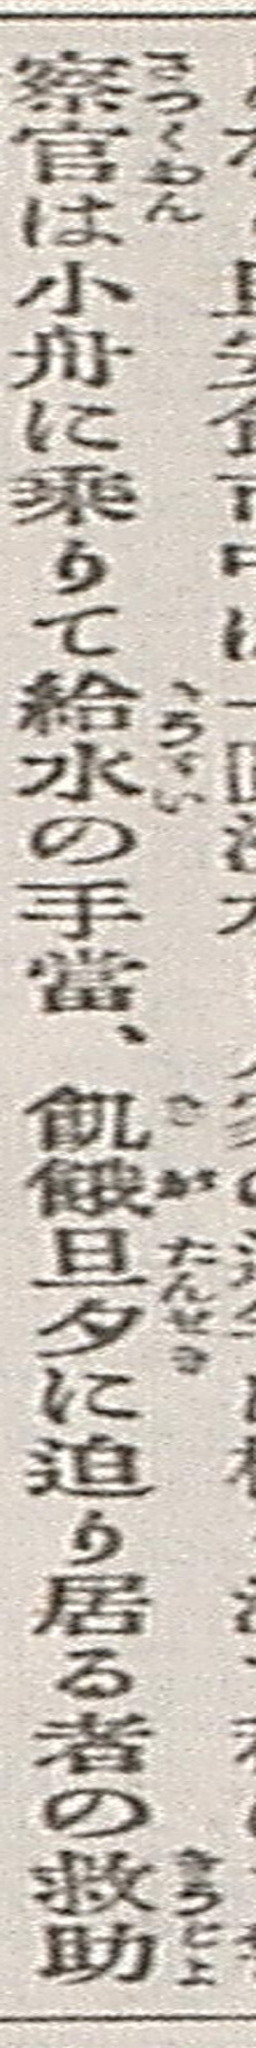察官は小舟に乗りて給水の手当、飢餓旦夕に迫り居る者の救助
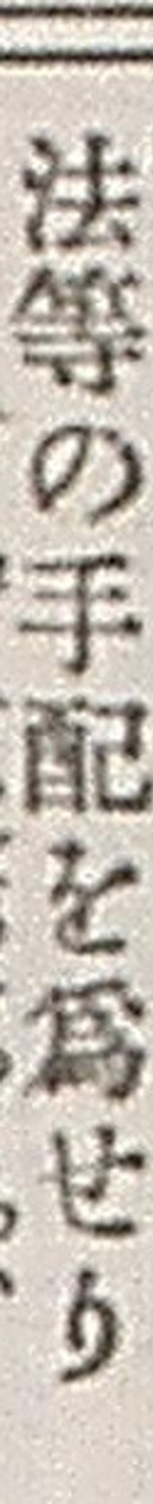法等の手配を為せり
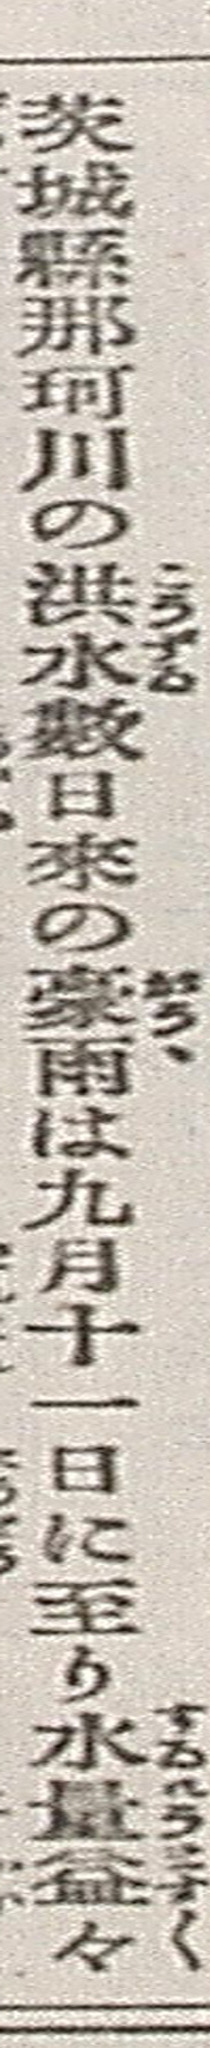茨城県那珂川の洪水数日来の豪雨は九月十一日に至り水量益々
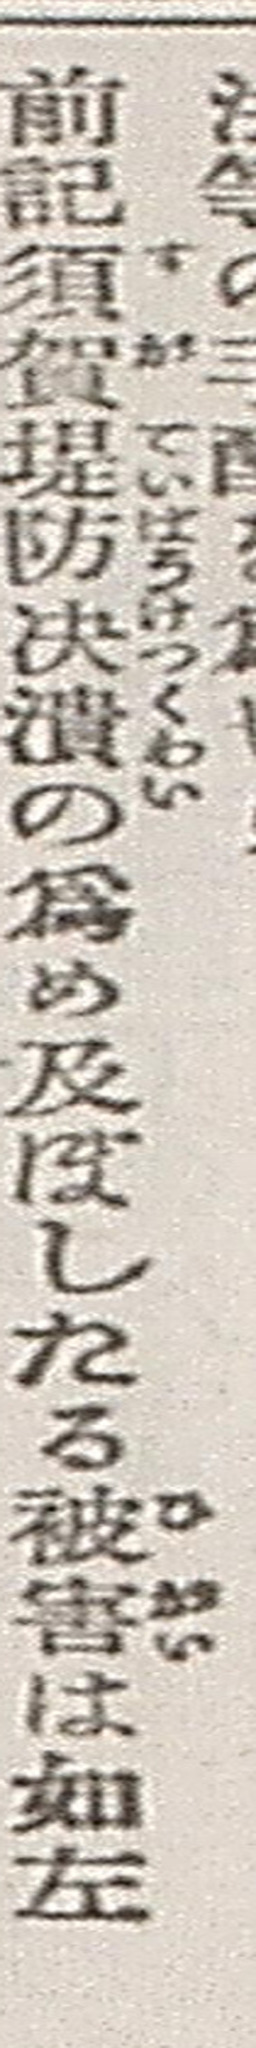前記須賀堤防决潰の為め及ぼしたる被害は如左
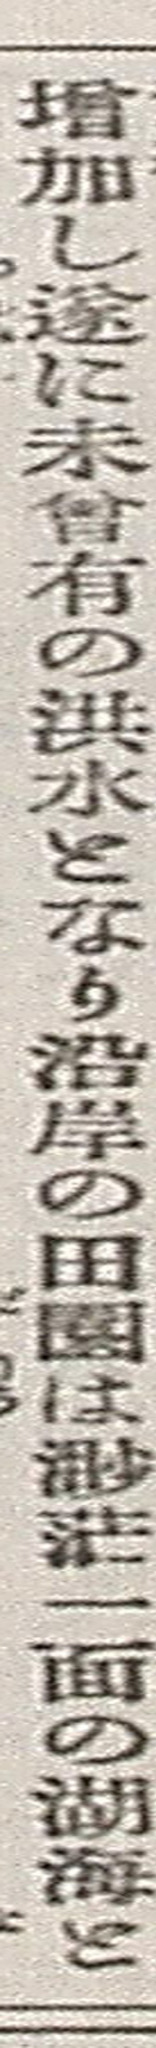増加し遂に未曾有の洪水となり沿岸の田園は渺茫一面の湖海と
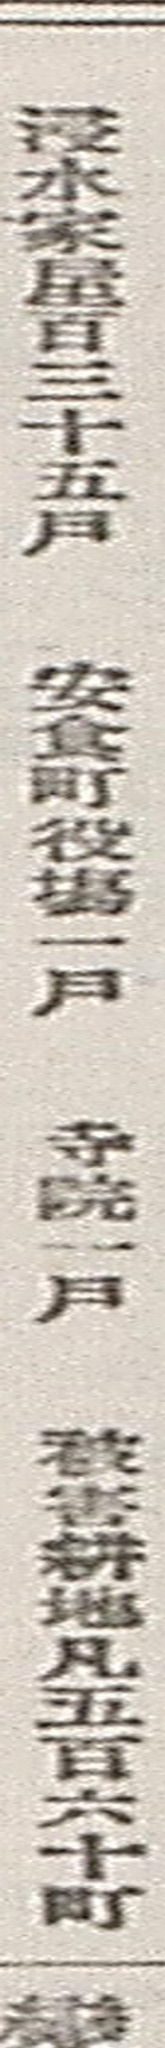浸水家屋百三十五戸安食町役場一戸寺院一戸被害耕地凡五百六十町
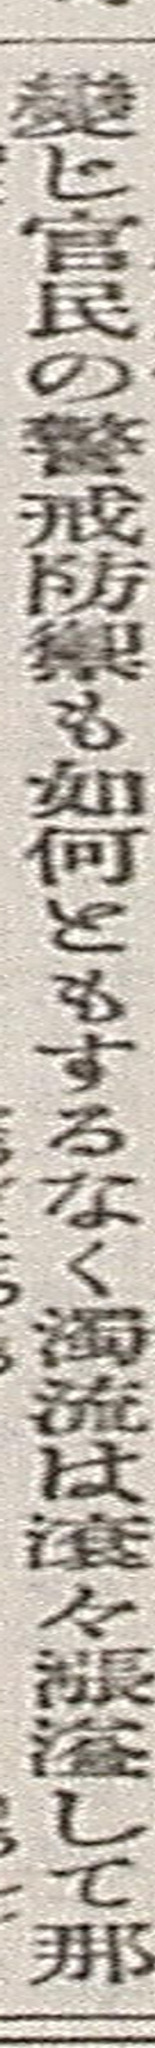変じ官民の警戒防禦も如何ともするなく濁流は滾々漲溢して那
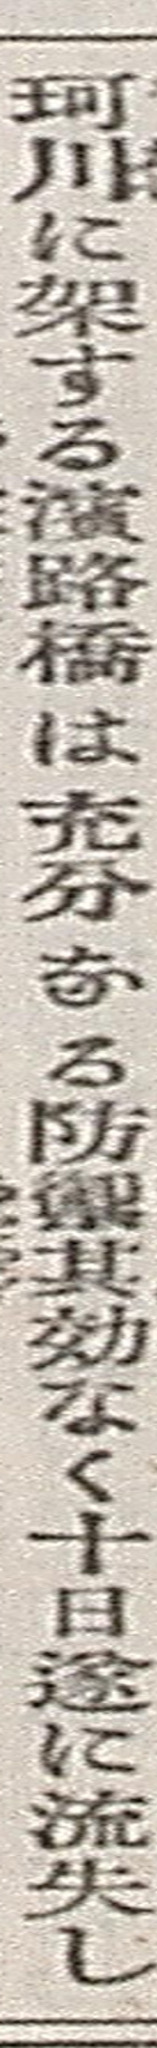珂川に架する浜路橋は充分なる防禦其効なく十日遂に流失し
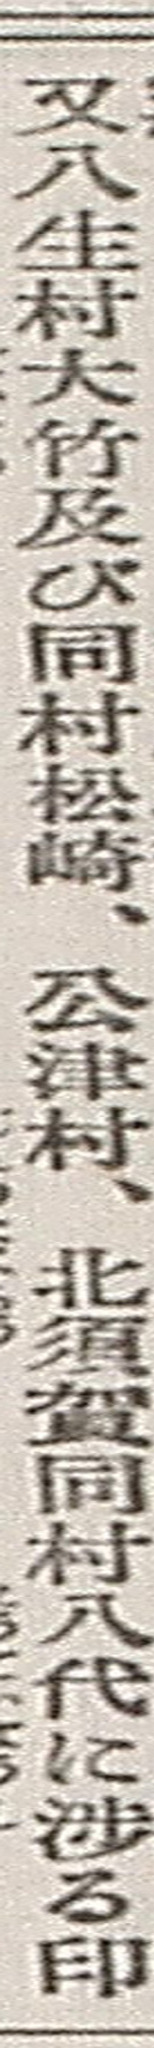又八生村大竹及び同村松崎、公津村、北須賀同村八代に渉る印
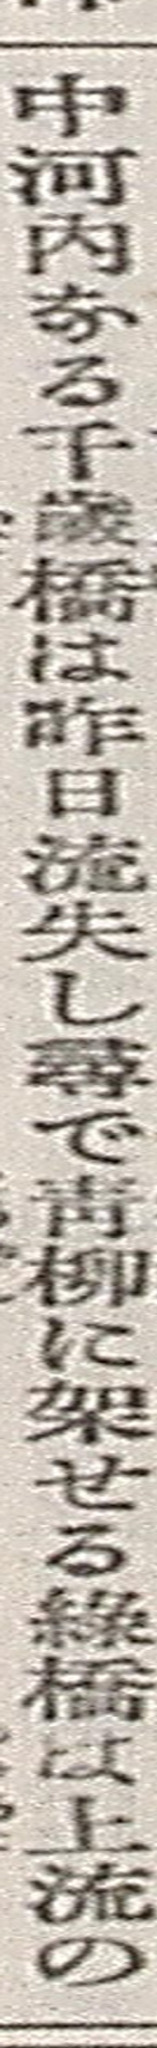中河内なる千歳橋は昨日流失し尋で青柳に架せる緑橋は上流の
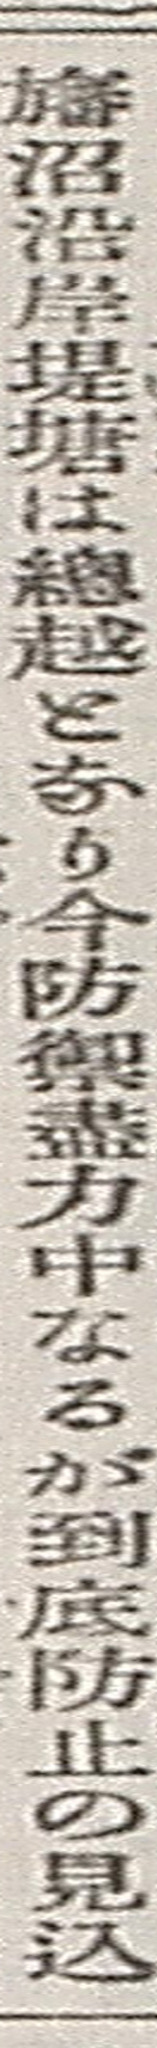旛郡沿岸堤塘は総越となり今防禦尽力中なるが到底防止の見込
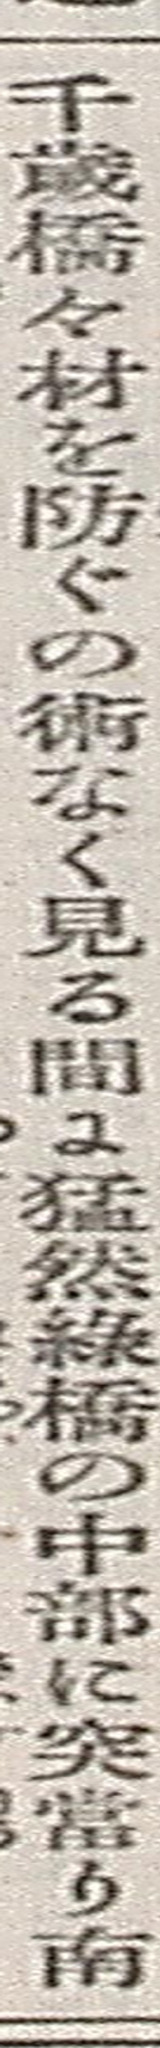千歳橋々材を防ぐの術なく見る間に猛然緑橋の中部に突当り南
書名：風俗畫報臨時増刊第百二十八號　洪水被害録（下）
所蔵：東京大学地震研究所図書室 Earthquake Research Institute Library, The University of Tokyo, JAPAN
